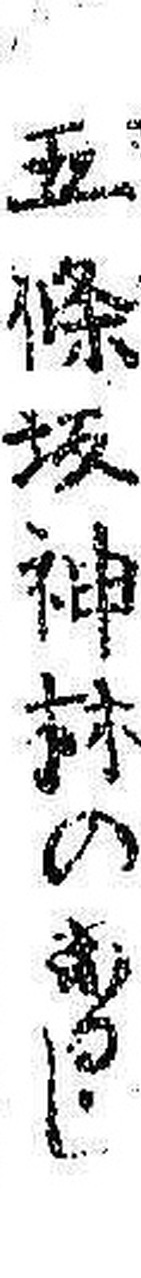五条坂神林のあるじ
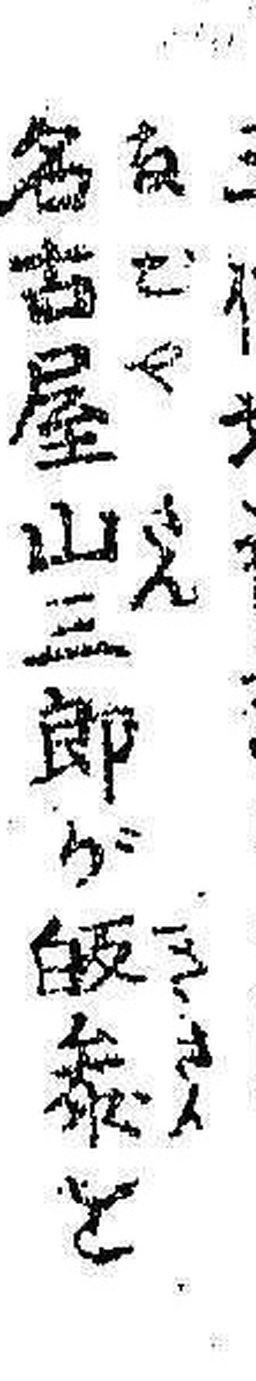名古屋山三郎が帰参を
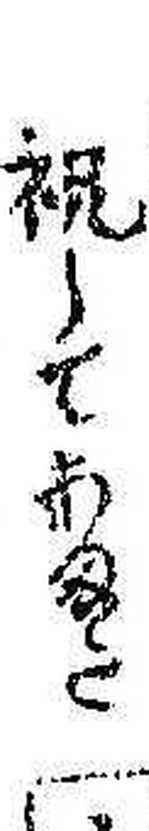祝してあまた
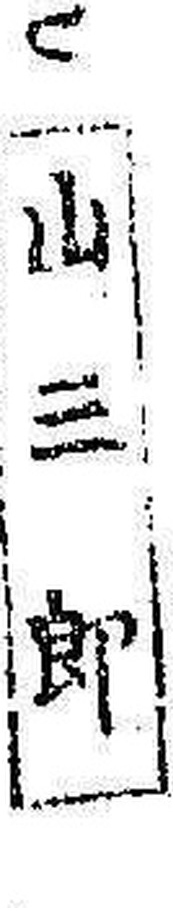山三郎
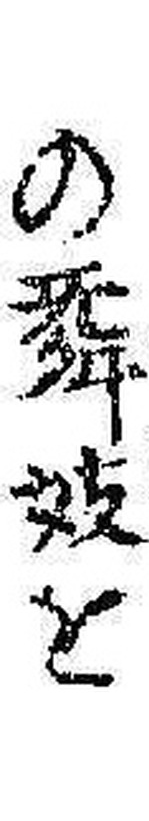の舞妓を
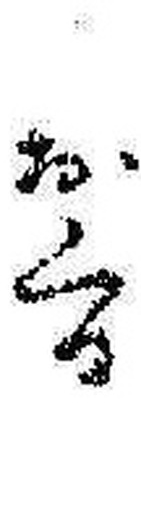おくる
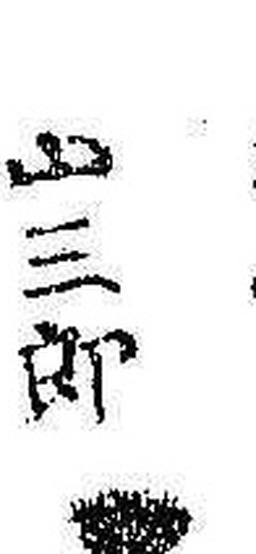山三郎
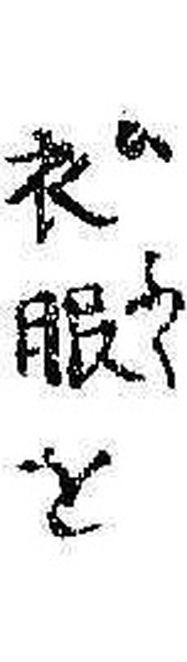衣服を
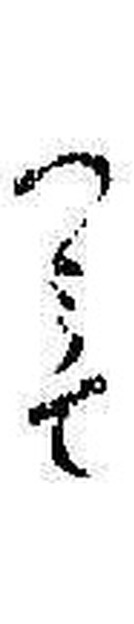つみて
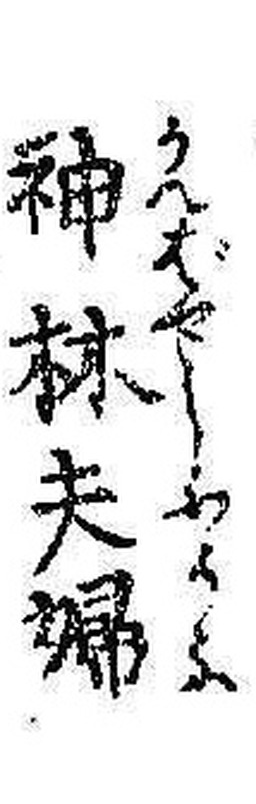神林夫婦
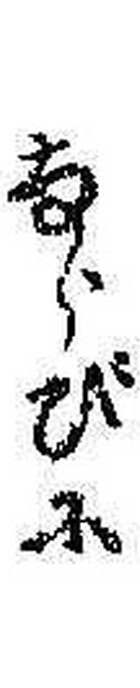ならびに
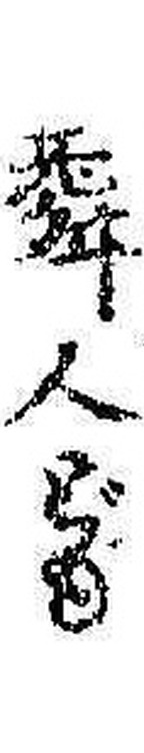舞人ども
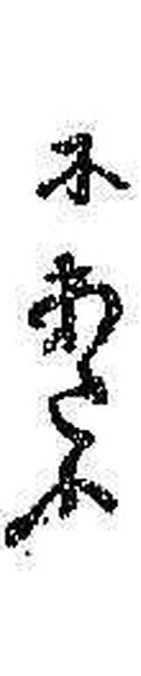にあたふ
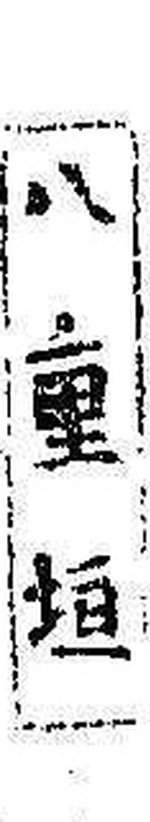八重垣
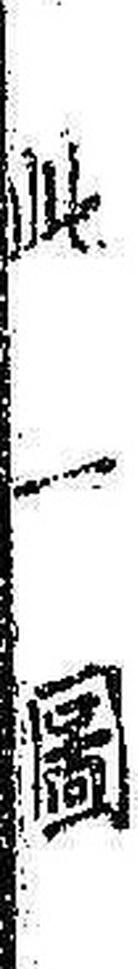此一図
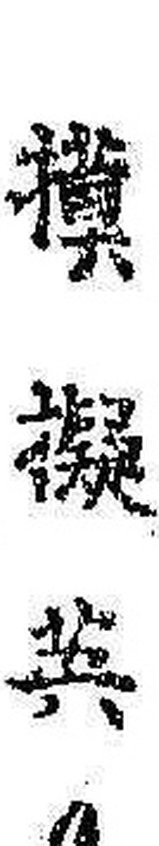模擬英
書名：昔話稲妻表紙
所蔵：国文学研究資料館
